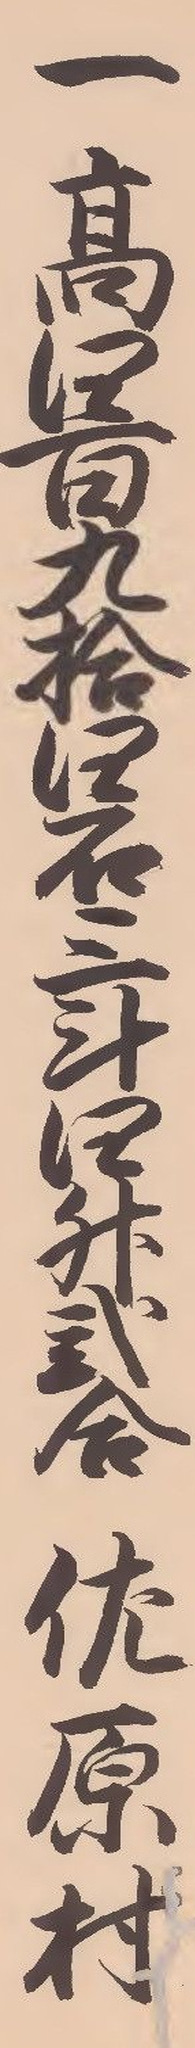一高四百九拾四石三斗四升弐合佐原村

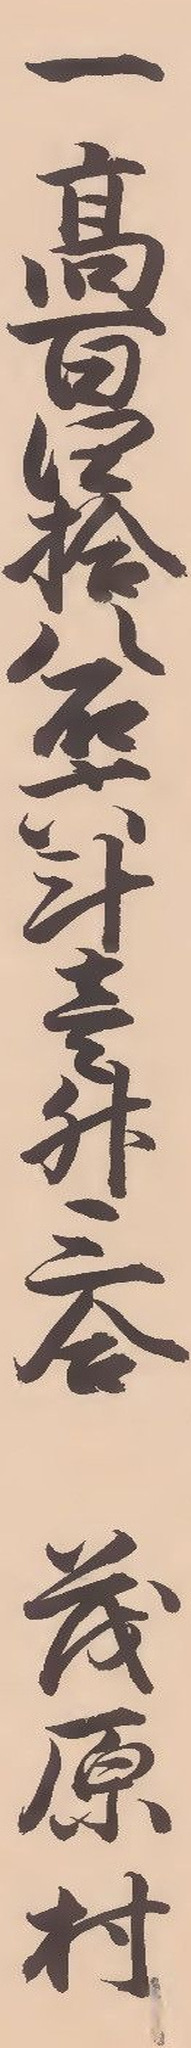一高百四拾八石六斗壱升三合茂原村
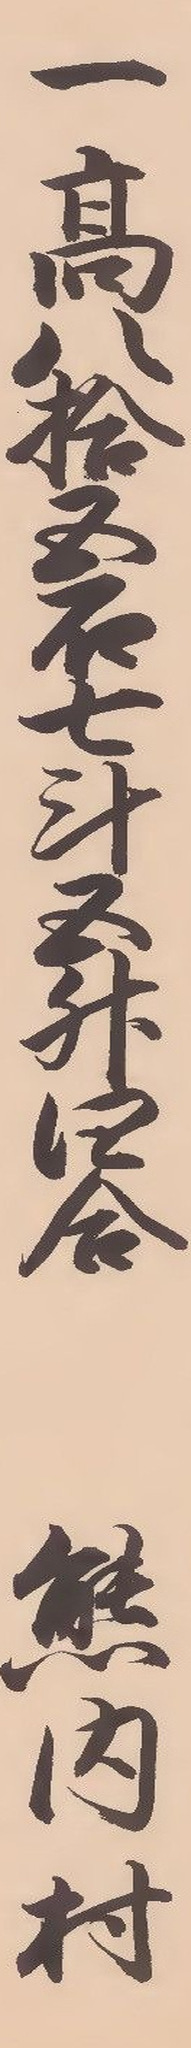一高八拾五石七斗五升四合熊内村
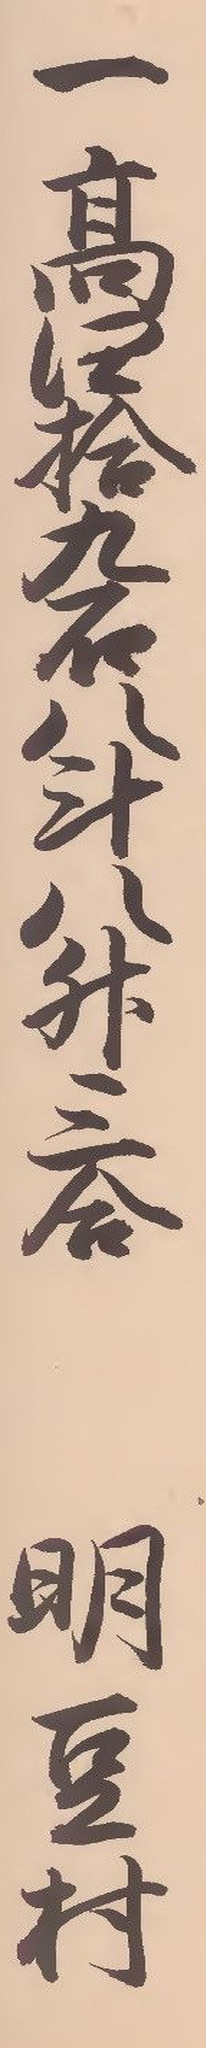一高四拾九石八斗八升三合明豆村
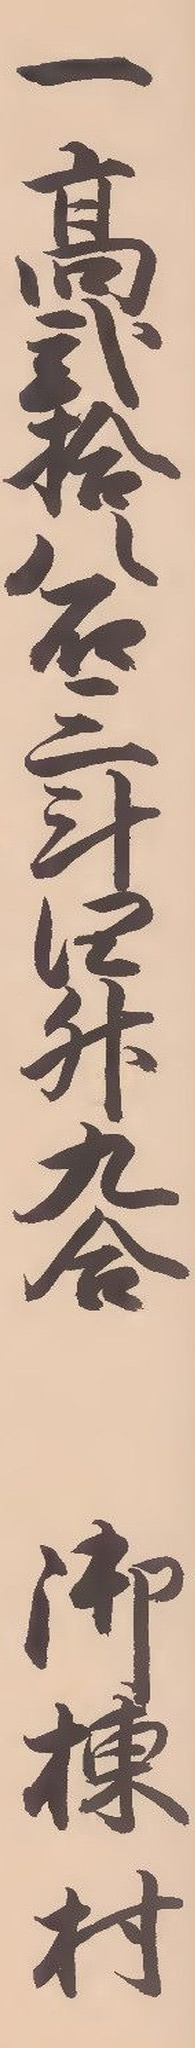一高弐拾八石三斗四升九合御棟村
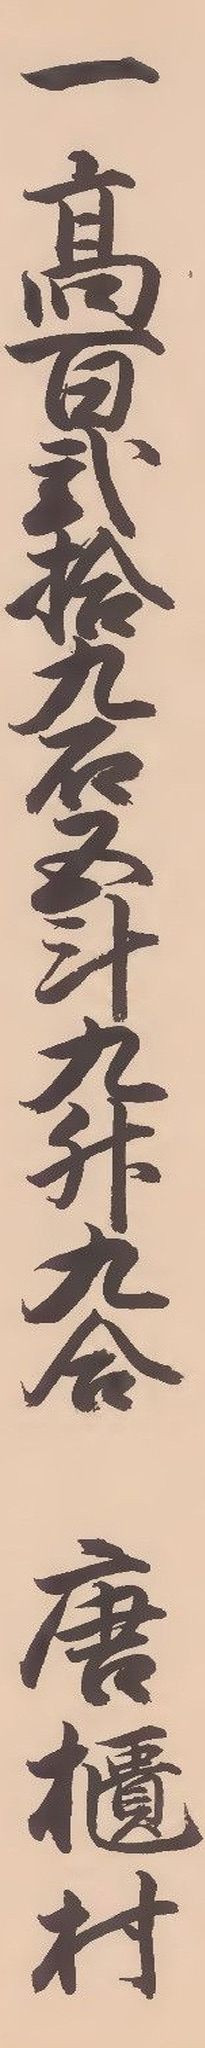一高百弐拾九石五斗九升九合唐櫃村
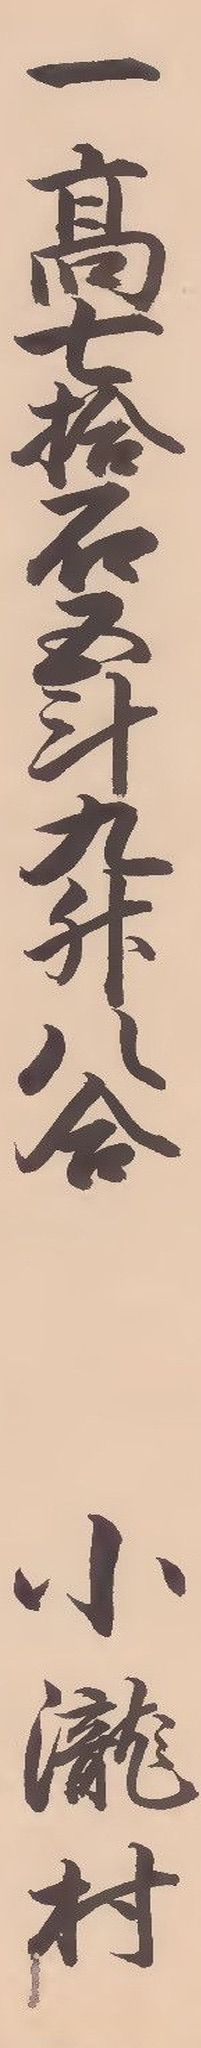一高七拾石五斗九升八合小滝村
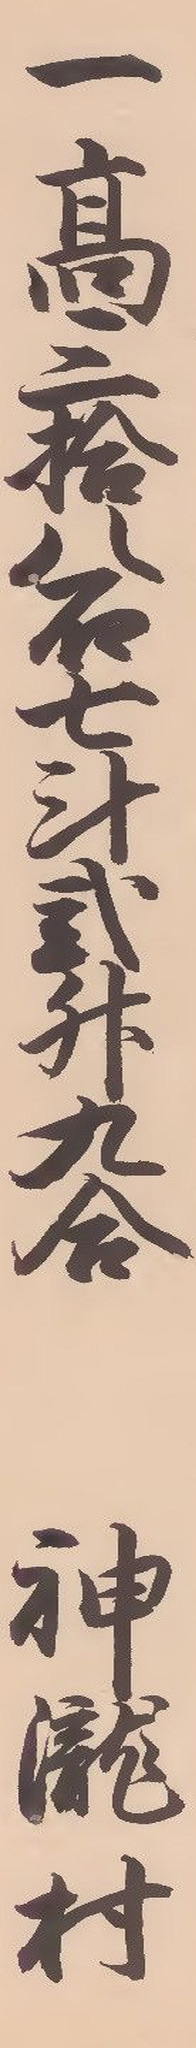一高三拾八石七斗弐升九合神滝村

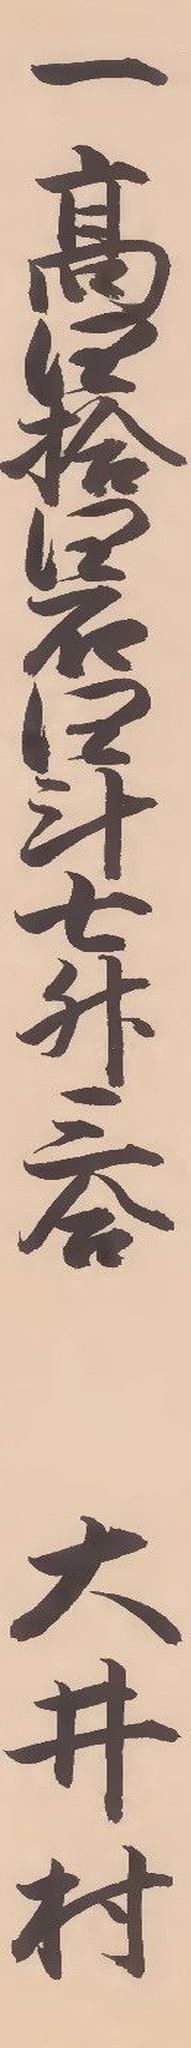一高四拾四石四斗七升三合大井村
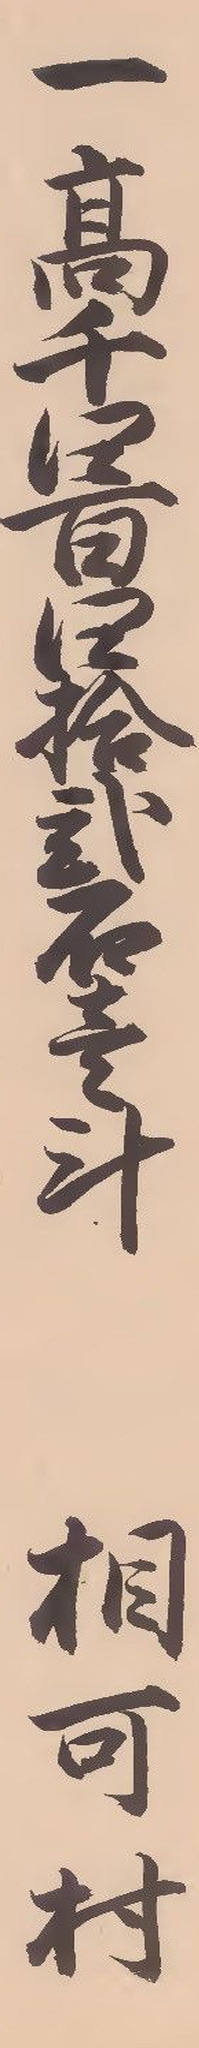一高千四百四拾弐石壱斗相可村
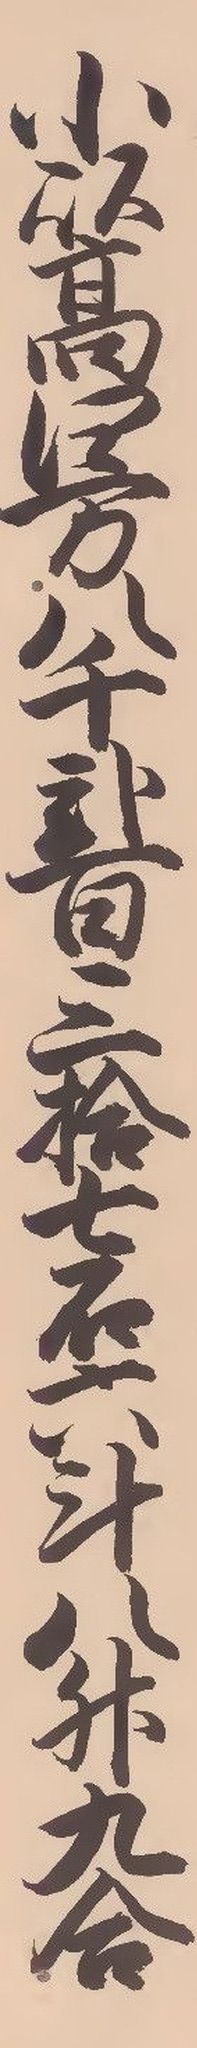小以高四万八千弐百三拾七石六斗八升九合

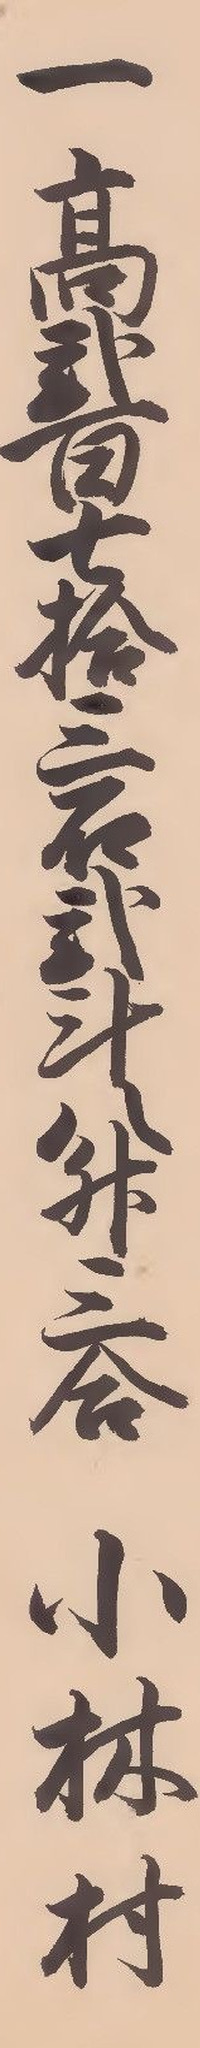一高弐百七拾三石弐斗八升三合小林村
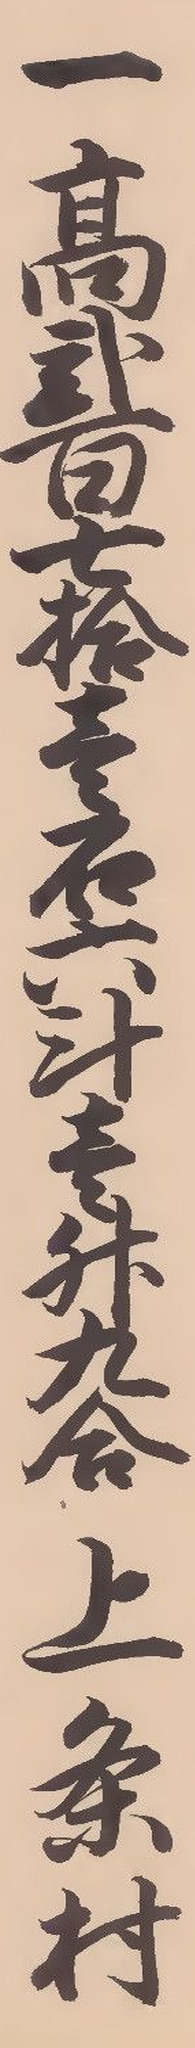一高弐百七拾壱石六斗壱升九合上条村
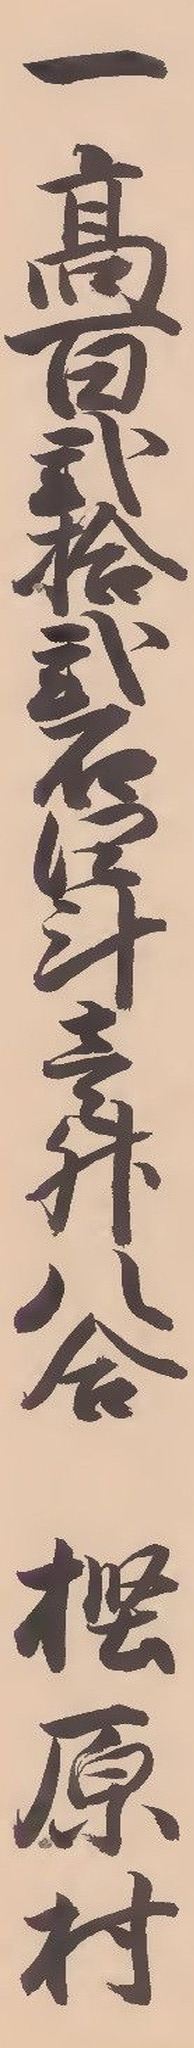一高百弐拾弐石四斗壱升八合樫原村

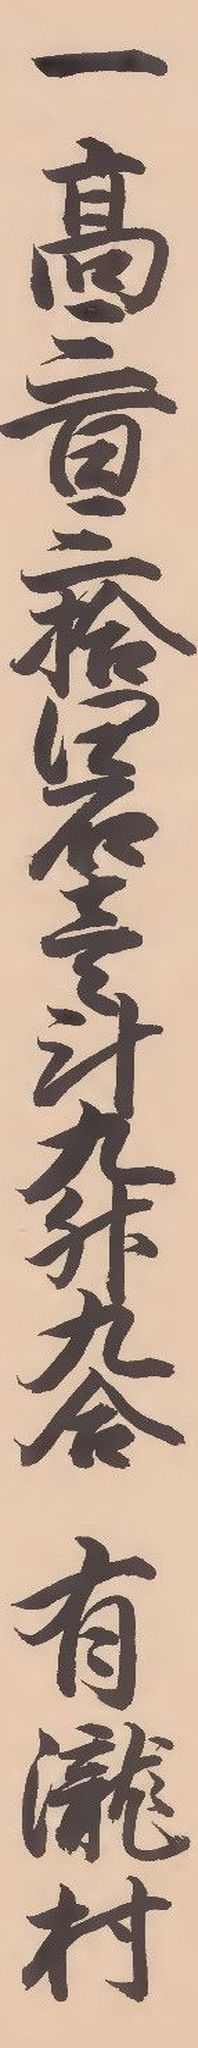一高三百三拾四石壱斗九升九合有滝村
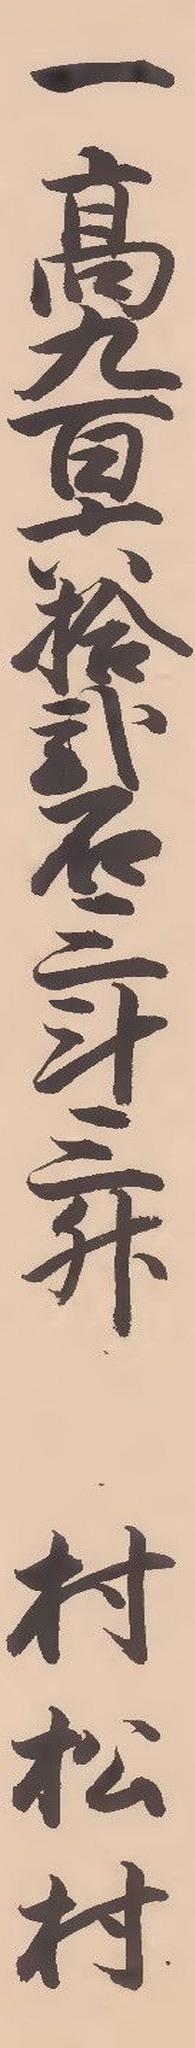一高九百六拾弐石三斗三升村松村
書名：伊勢国郷帳
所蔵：国立公文書館 National Archives of Japan
